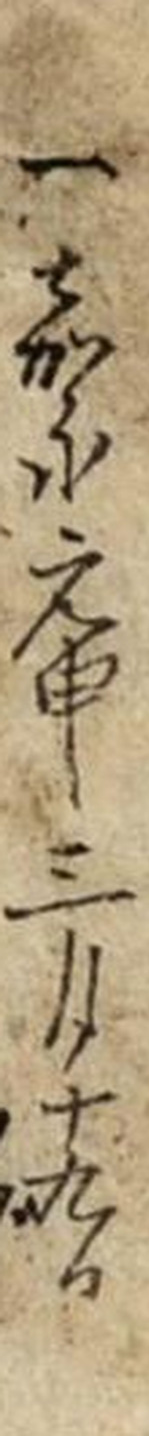一嘉永元申三月十九日
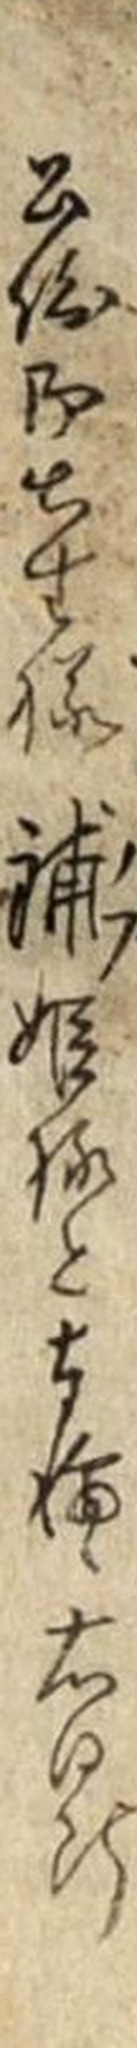公儀御出生様鋪姫君様と奉称候右同断
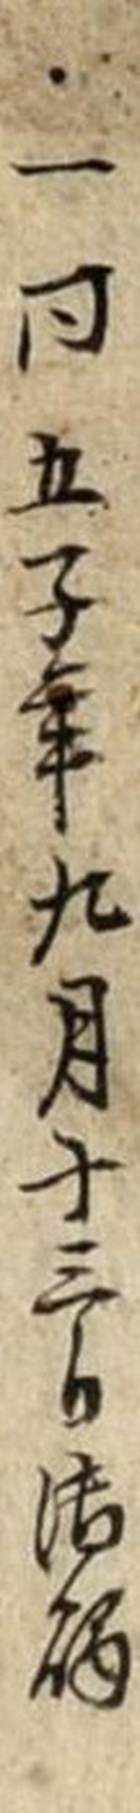一同五子年九月十三日御触
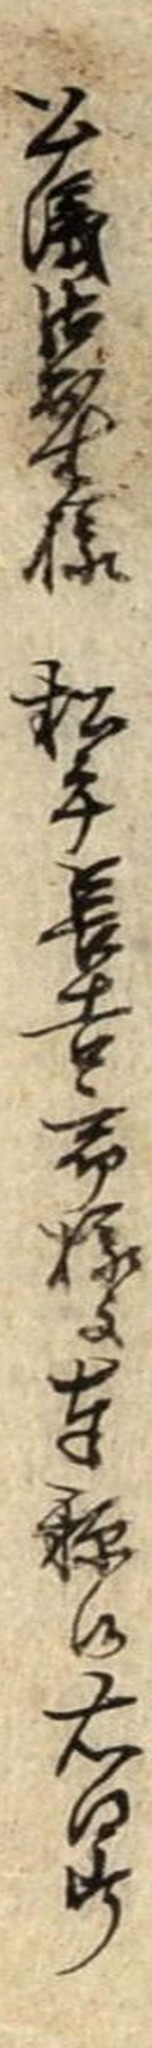公儀御出生様松平長喜吉郎様と奉称候右同断

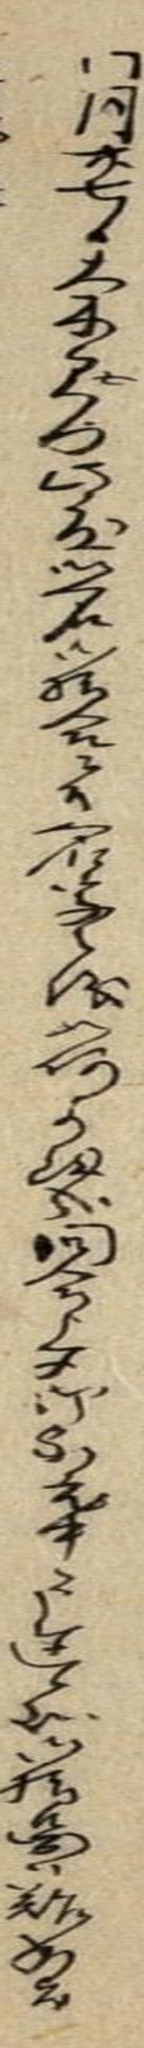一同月廿七日大木与五右衛門此度御名御指合に付名字之儀如何に致候哉問合候処御家老中に達候処御差図は難成旨
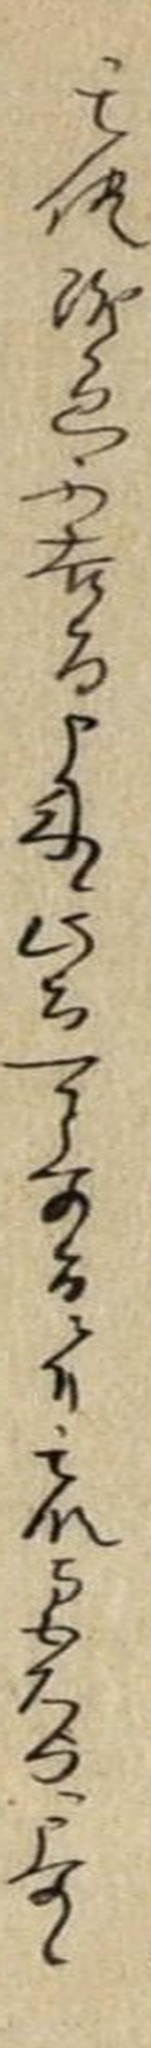其侭致置不苦候旨申来候此旨可申聞候旨に付其段与五右衛門へ申聞候
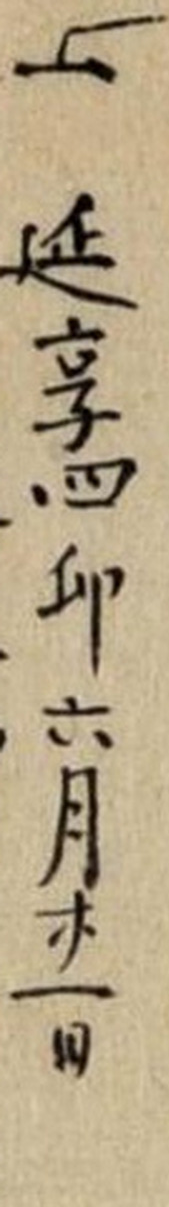一延享四卯六月廿一日
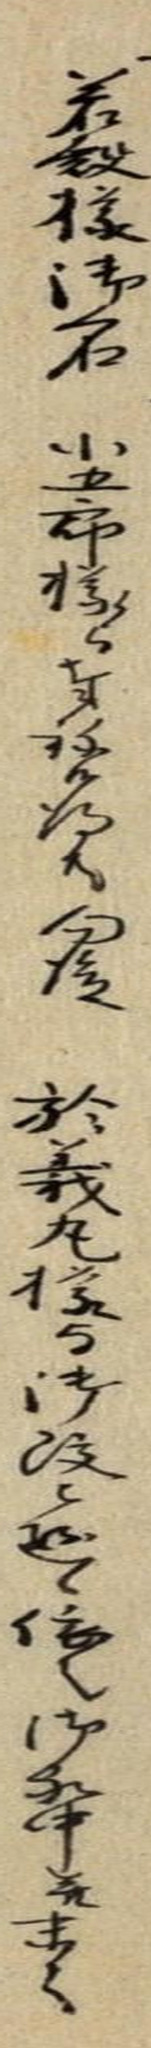若殿様御名小五郎様と奉称候得共向後於義丸様と御改被遊候依之御家中并末々
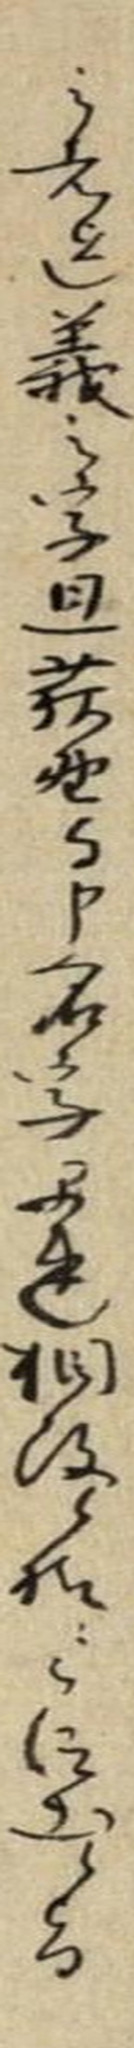之者迄義之字且荻野と申名字早速相改候様被仰出候旨
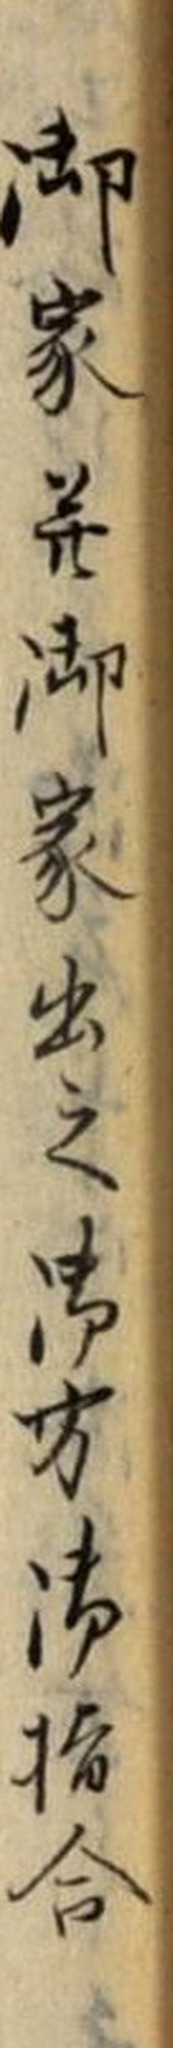御家并御家出之御方御指合
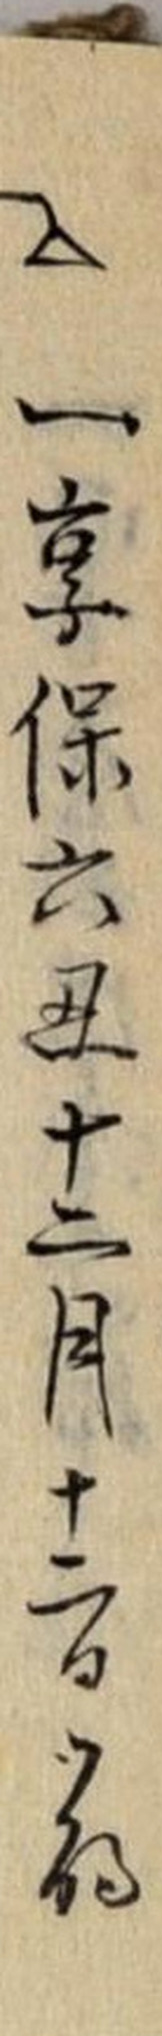△一享保六丑十二月十二日御触
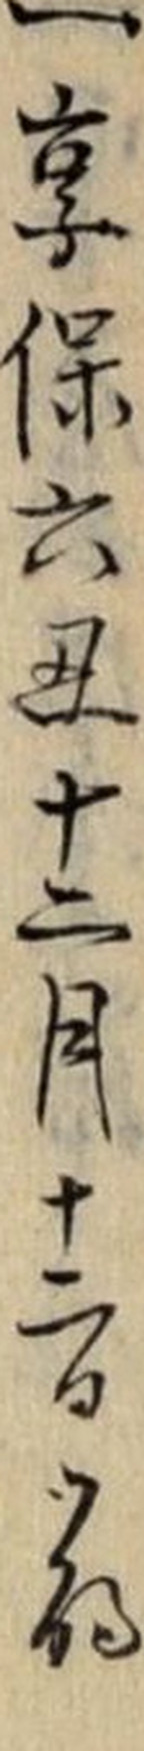△一享保六丑十二月十二日御触
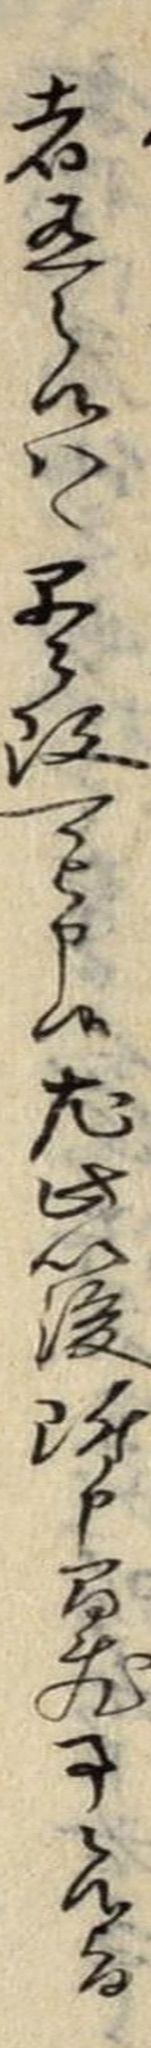者有之候はゝ早々改可被申候尤此以後附申間敷事に候旨
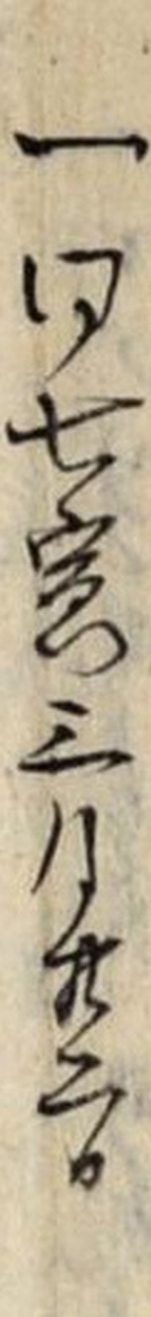一同七寅三月廿二日
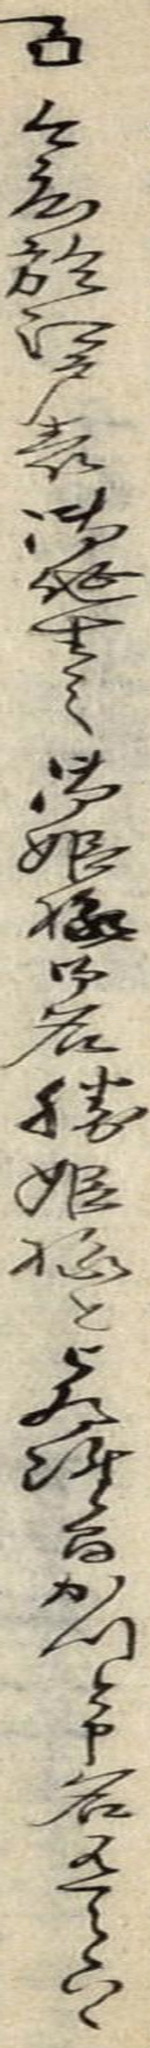今度於江戸表御誕生之御姫様御名勝姫様と被為附候間かつと申名有之候はゝ
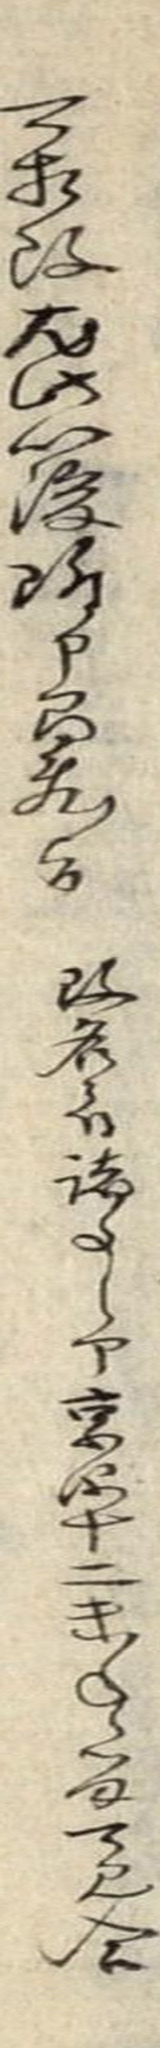可相改尤此以後附申間敷旨改名に付諸事之部享保十二未年之留可見合
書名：蒐輯之部
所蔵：福井県文書館 Fukui Prefectural Archives
